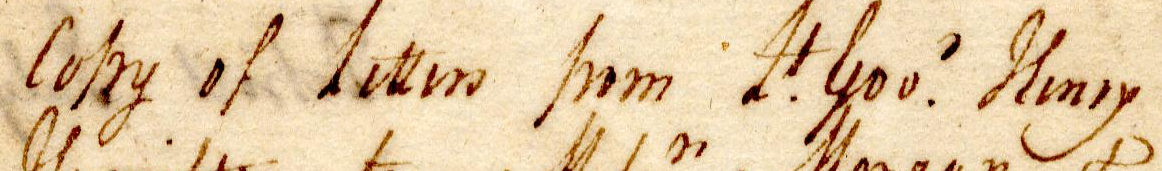Copy of Letters from L^t. Gov^r: Henry
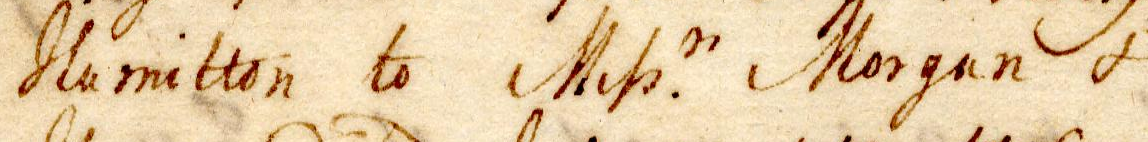Hamilton to Maj^r. Morgan &
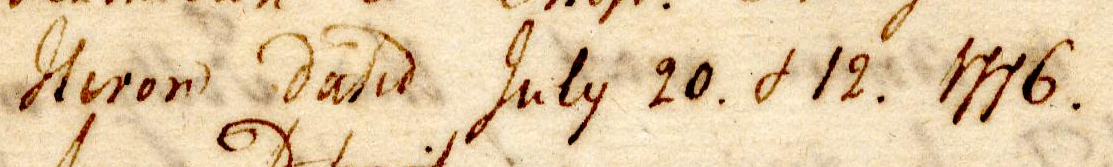Heron dated July 20. & 12. 1776.
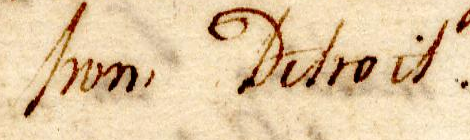from Detroit.
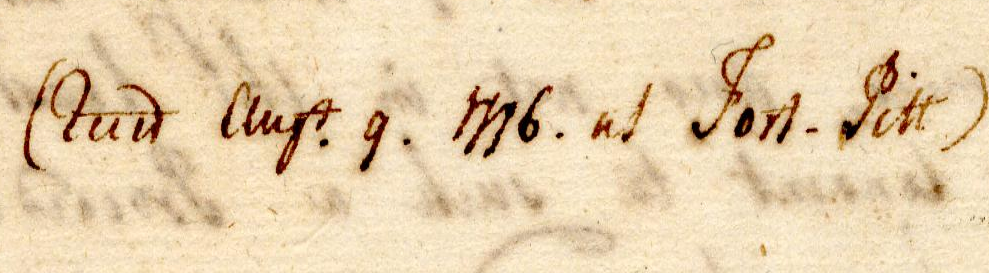(reced Aug^t. 9. 1776. at Fort-Pitt)
